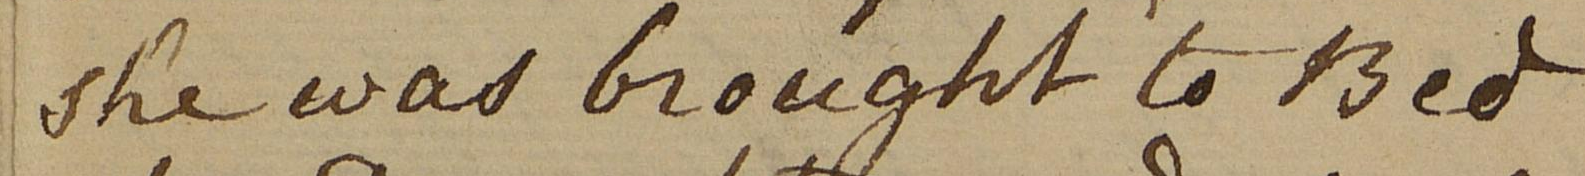she was brought to Bed
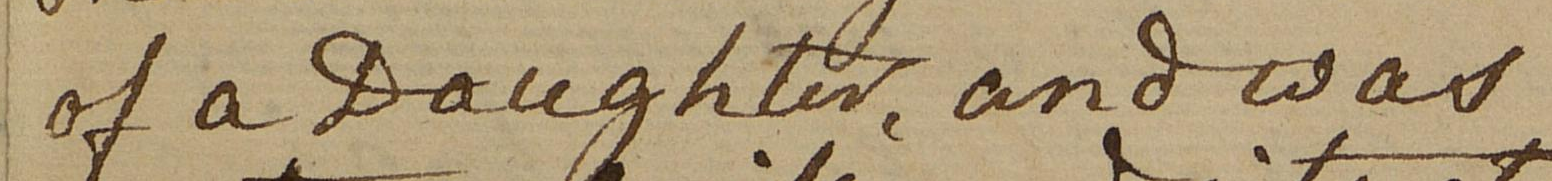of a Daughter, and was
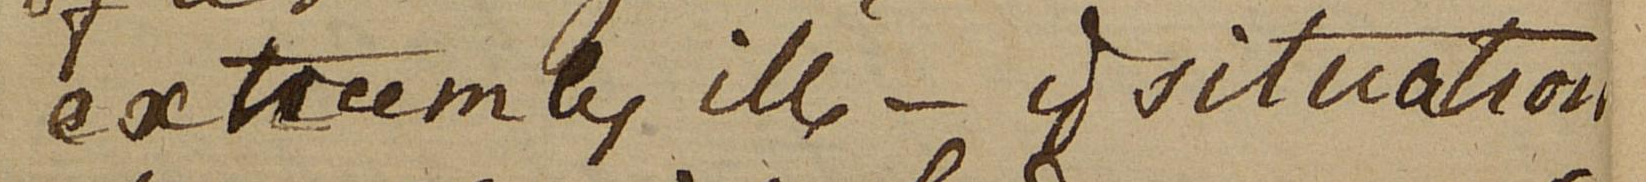extreemly ill- y^e situation
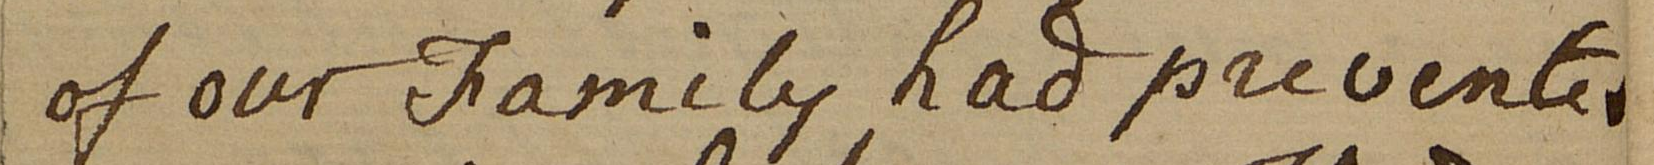of our Family had prevented
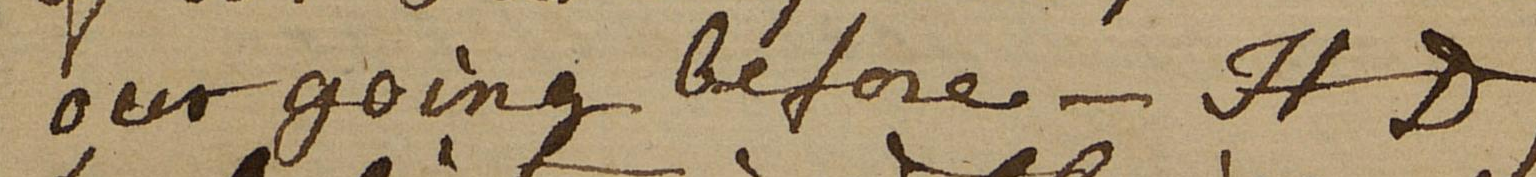our going before- HD
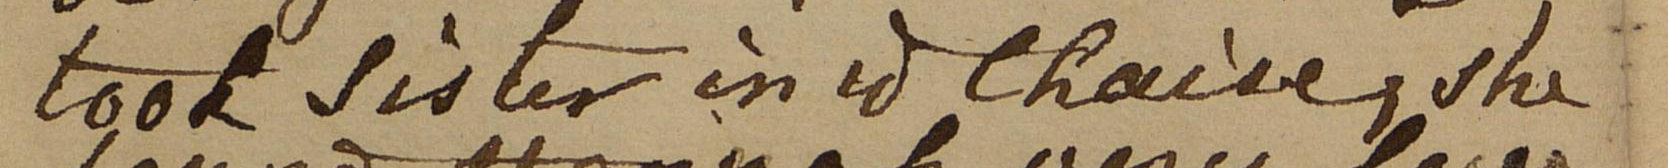took Sister in y^e Chaise, she
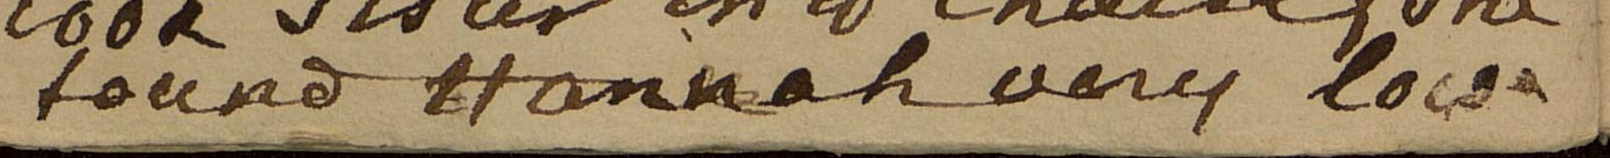found Hannah very low
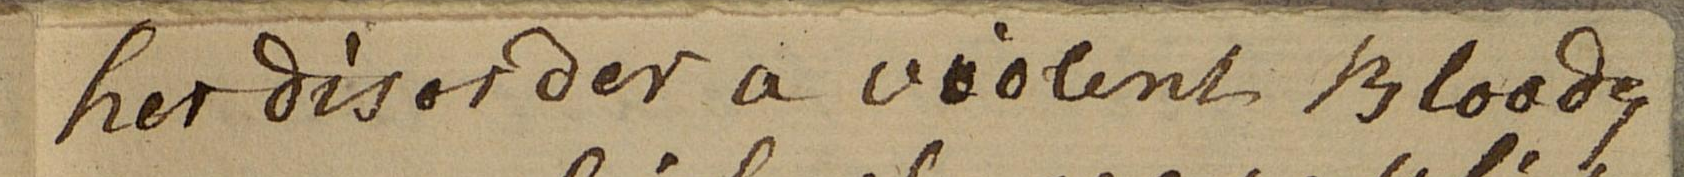her disorder a violent Bloody
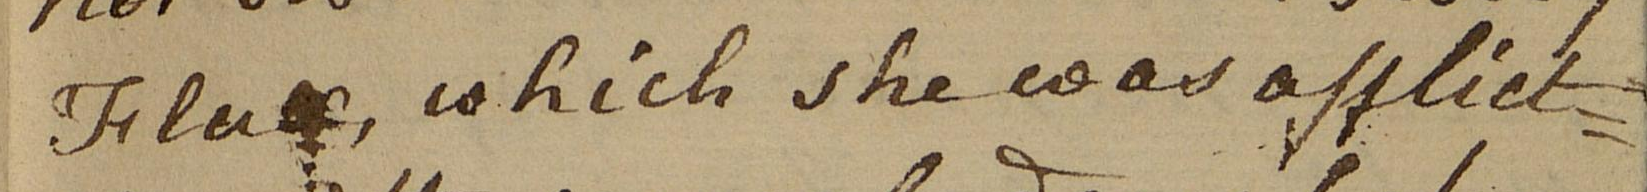Flux, which she was afflict-
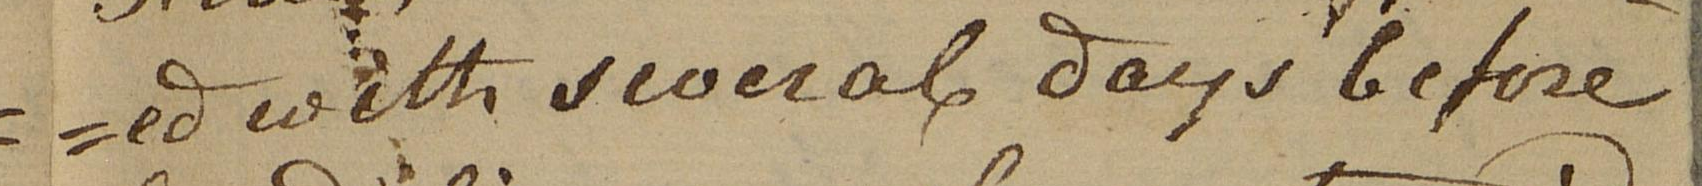-ed with several days before
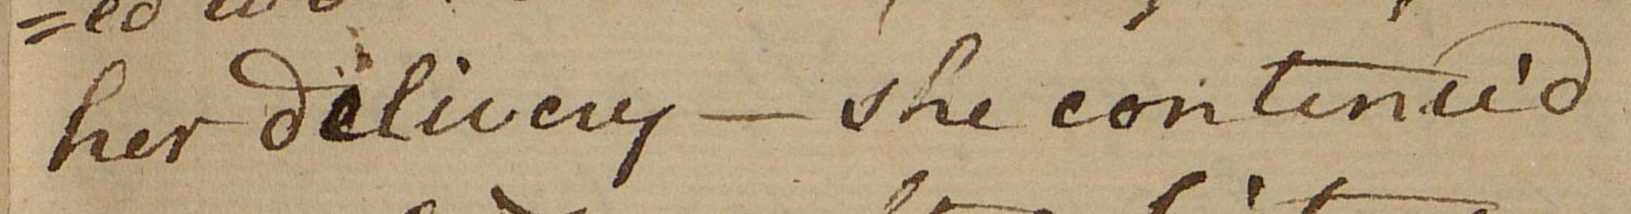her delivery- she continu'd
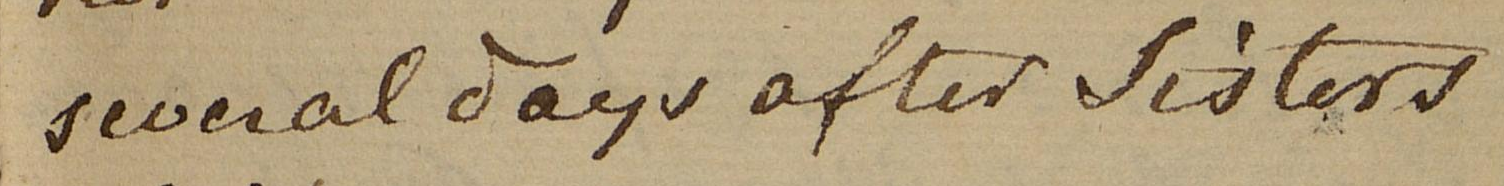several days after Sisters
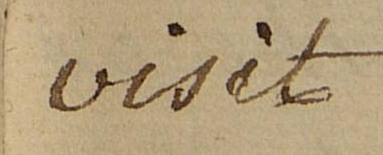visit
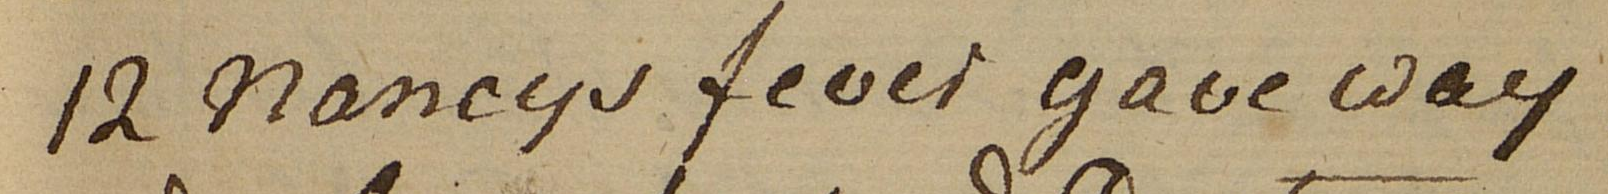12 Nancys fever gave way
